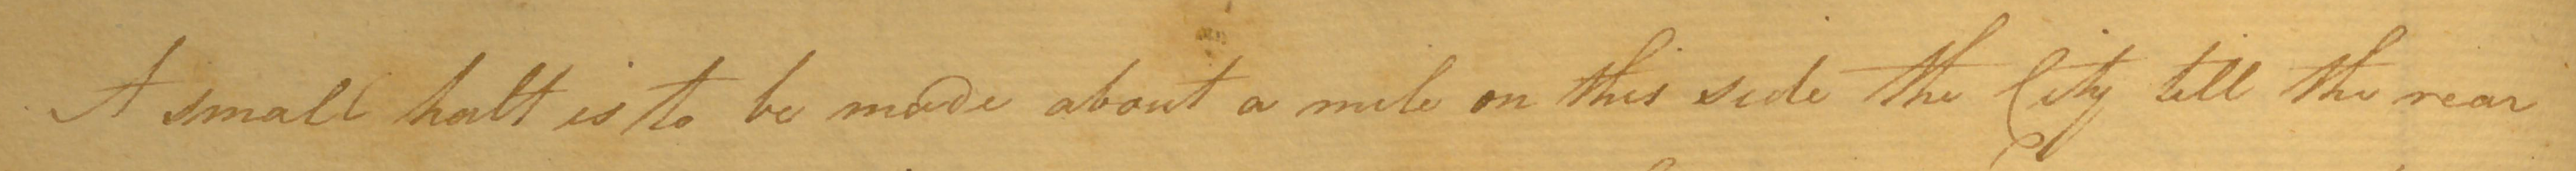A small halt is to be made about a mile on this side of the City till the rear
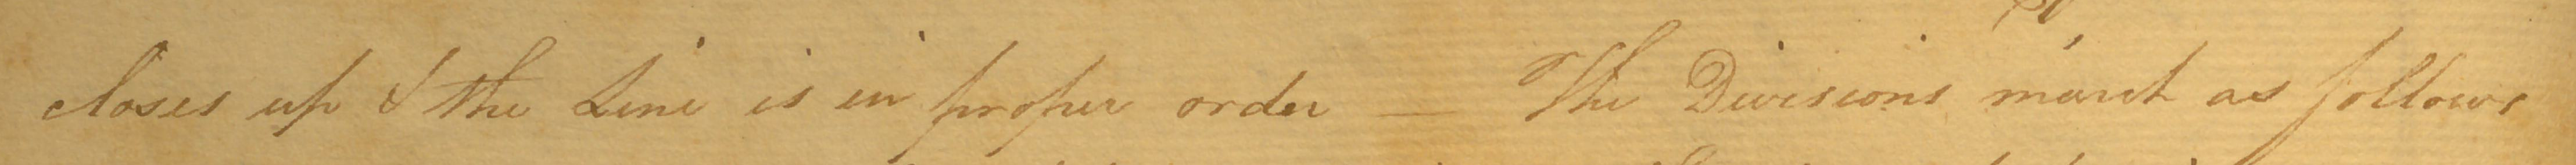closes up & the Line is in proper order- The Divisions march as follows
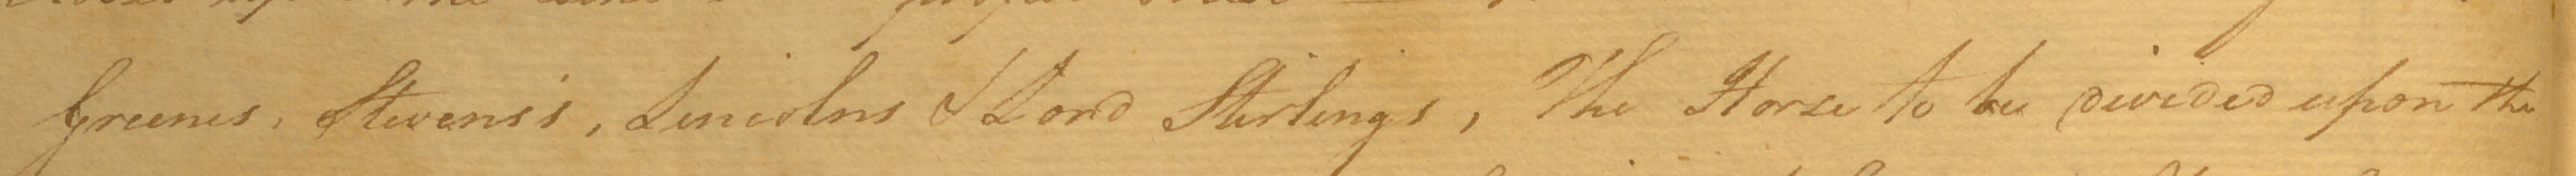Greenes, Stevens's, Lincolns & Lord Stirlings, The Horse to be divided upon the
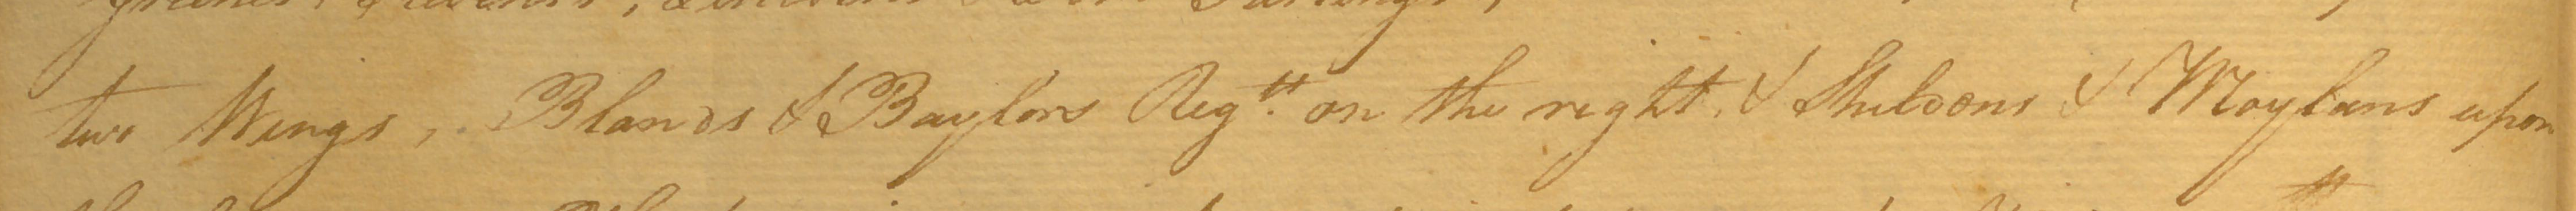two Wings, Blands & Baylors Reg^t. on the right & Sheldons & Moylans upon
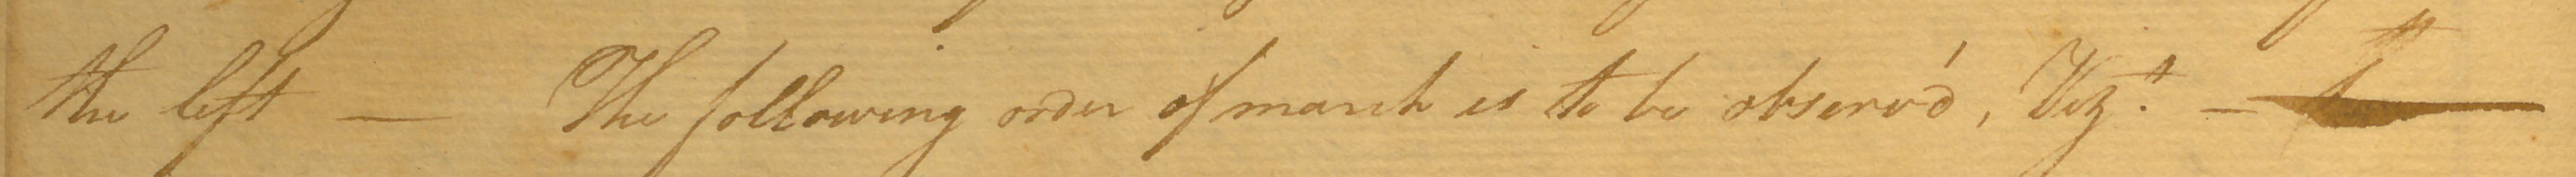the left- The following order of march is to be observ'd, Viz^t.-
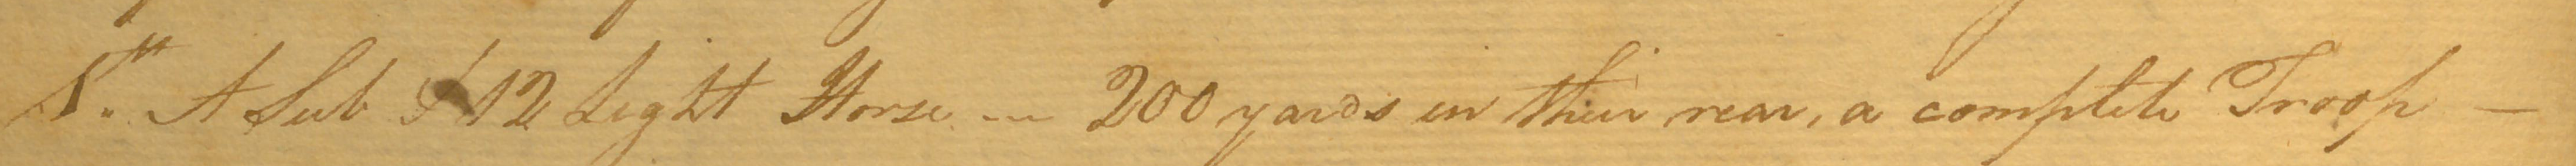1^th. A Sub & 12 Light Horse - 200 yards in their rear, a complete Troop-
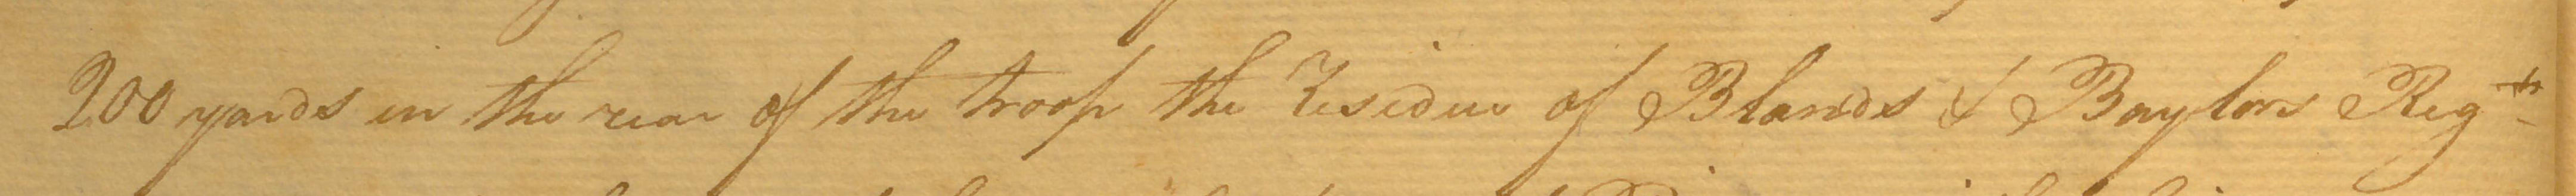200 yards in the rear of the troop the Residue of Blands & Baylors Reg^ts
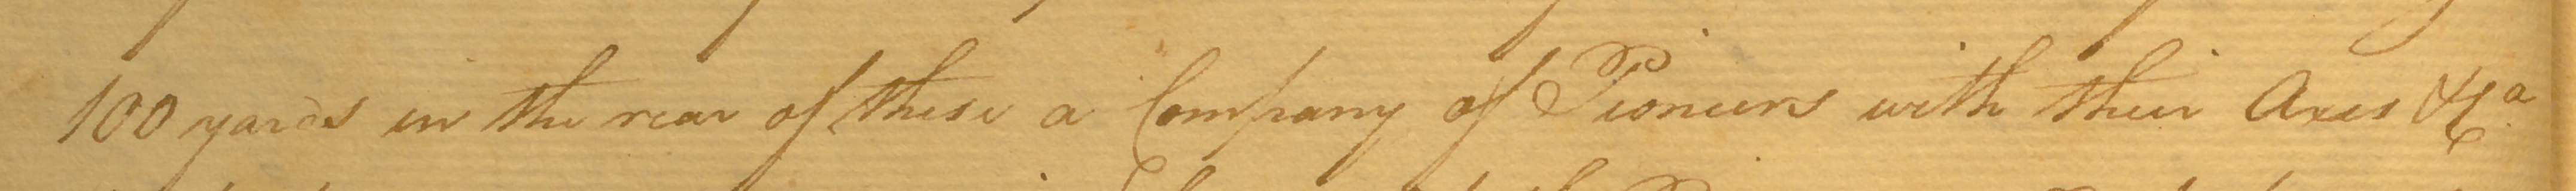100 yards in the rear of these a Company of Pioneers with their Axes &c^a.
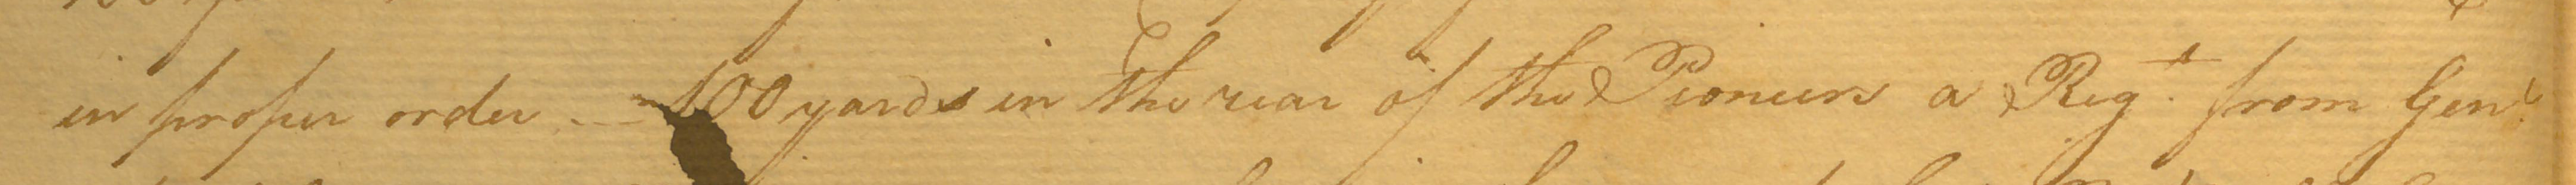in proper order. 100 yards in the rear of the Pioneers a Reg^t. from Gen^l.
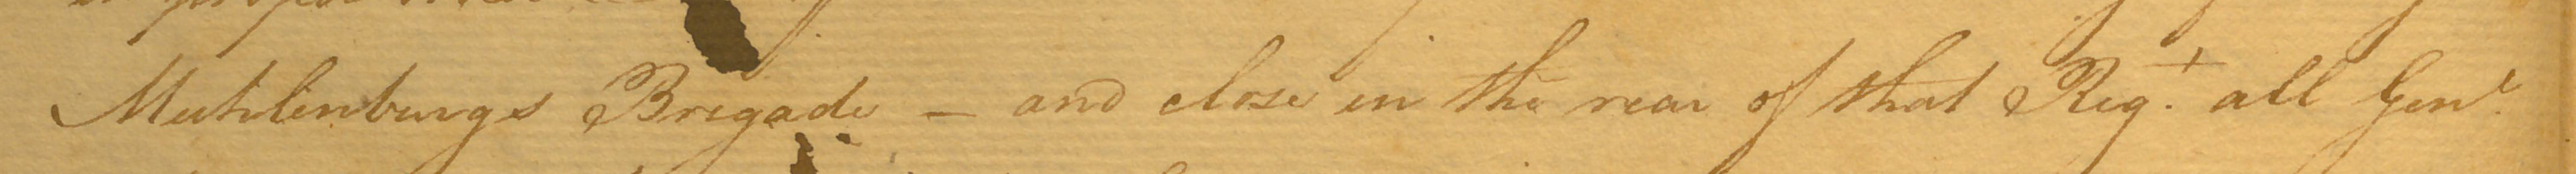Muhlinburgs Brigade- and close in the rear of that Reg^t. all Gen^l.
